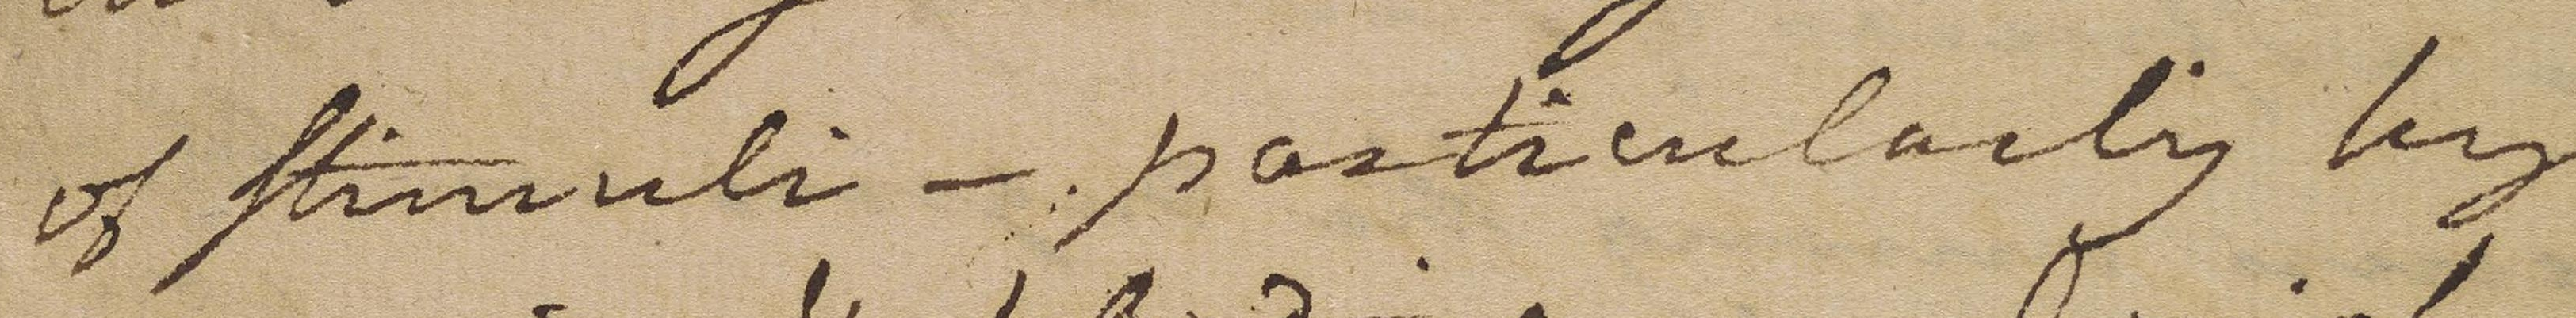of stimuli, particularly by
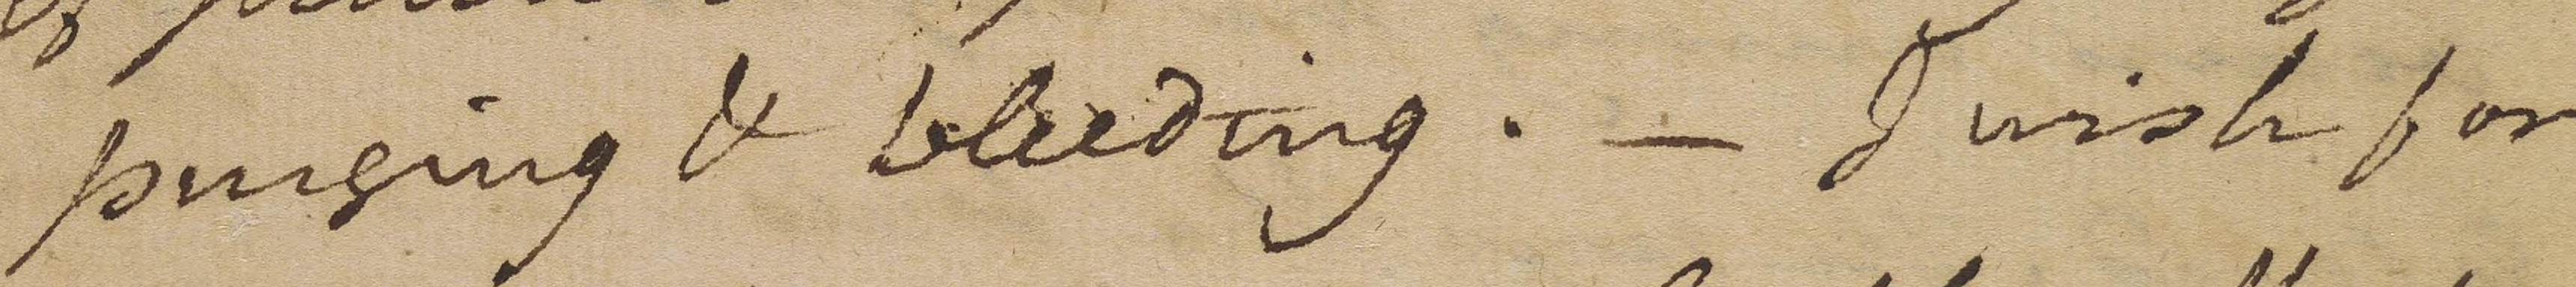purging & bleeding. I wish for
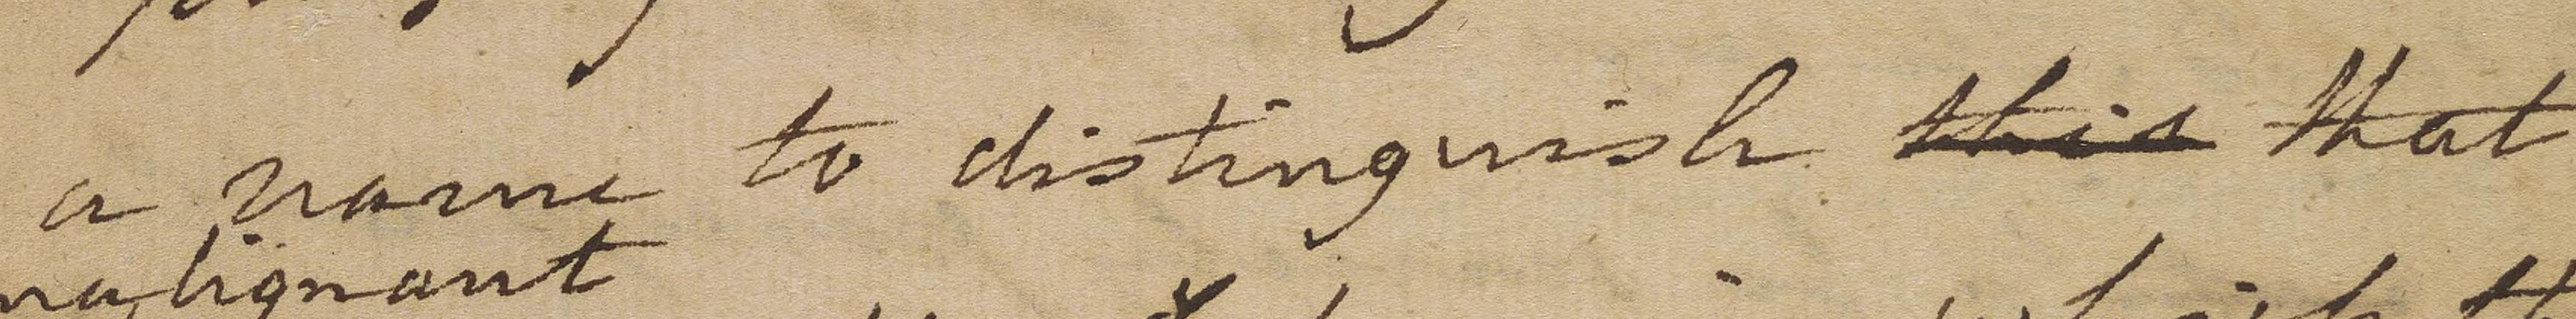a name to distinguish this that
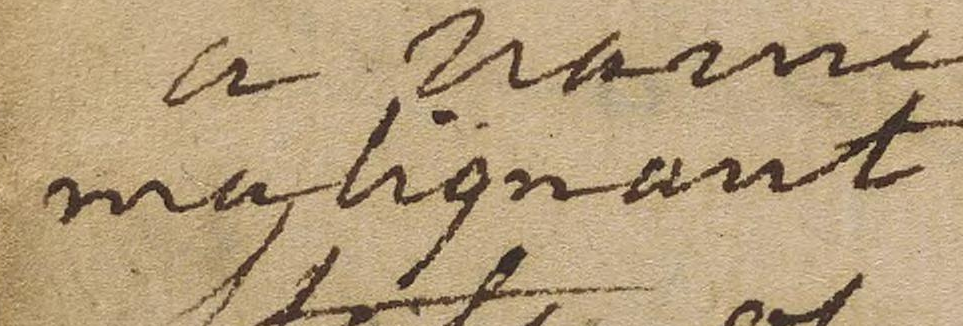malignant
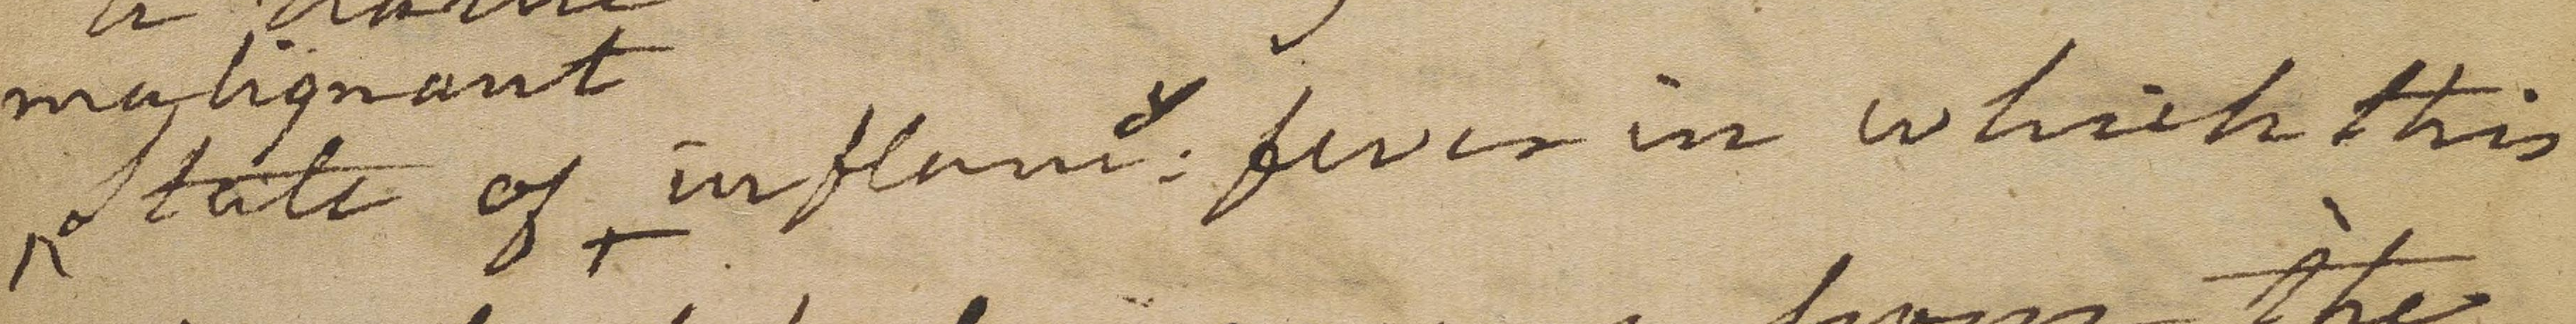^ state of inflam^y fever in which this
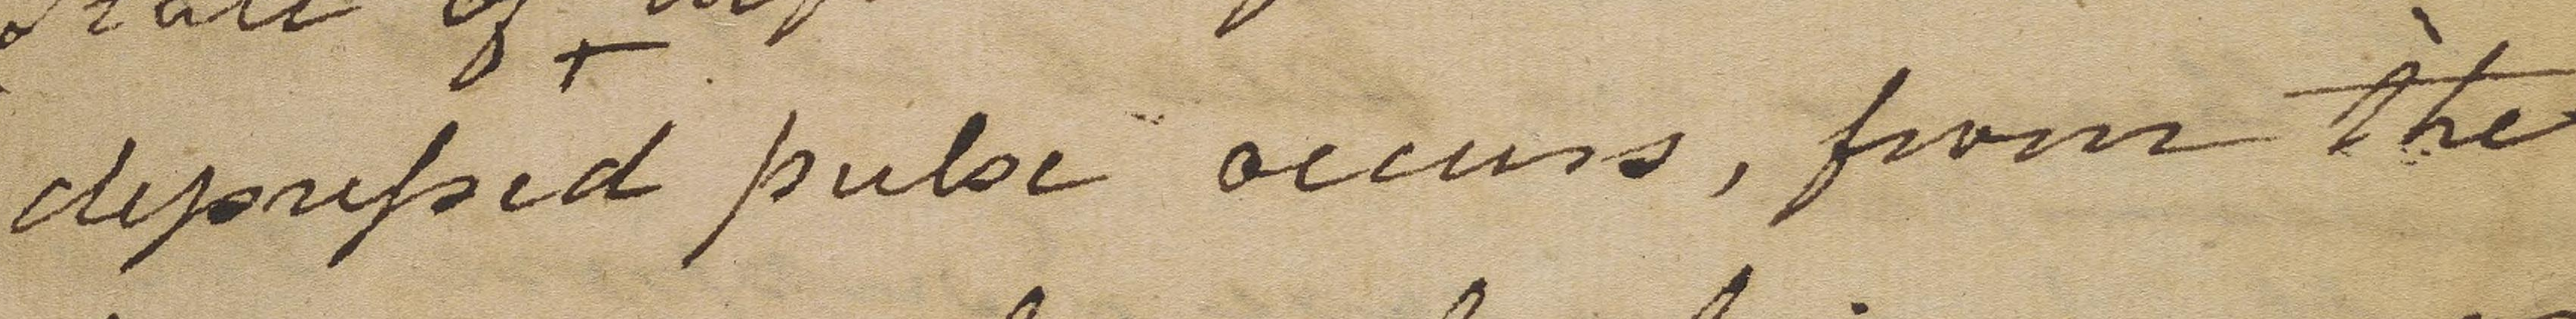depressed pulse occurs, from the
